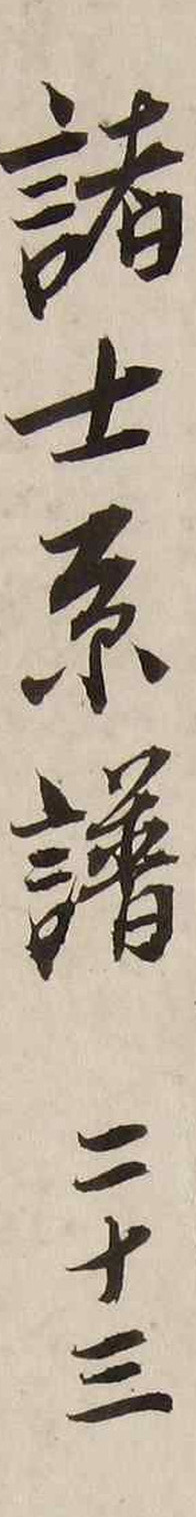諸士系譜二十三

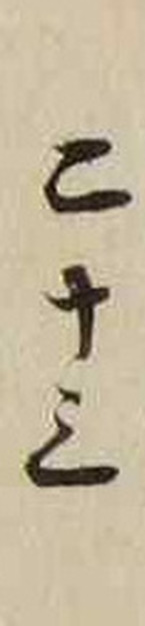二十三
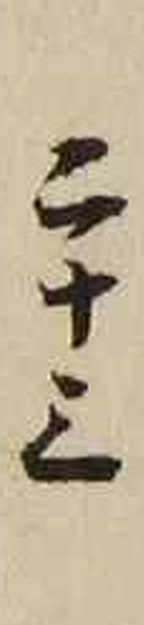二十三

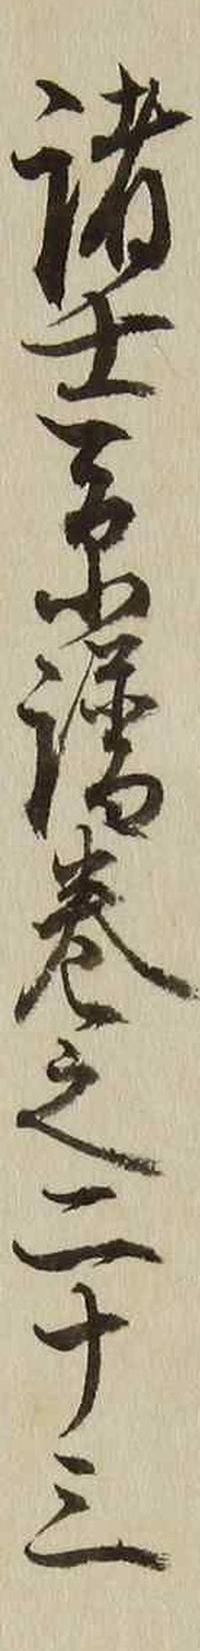諸士系譜巻之二十三
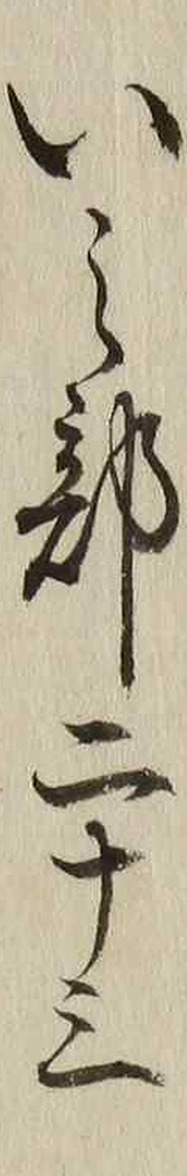い之部二十三
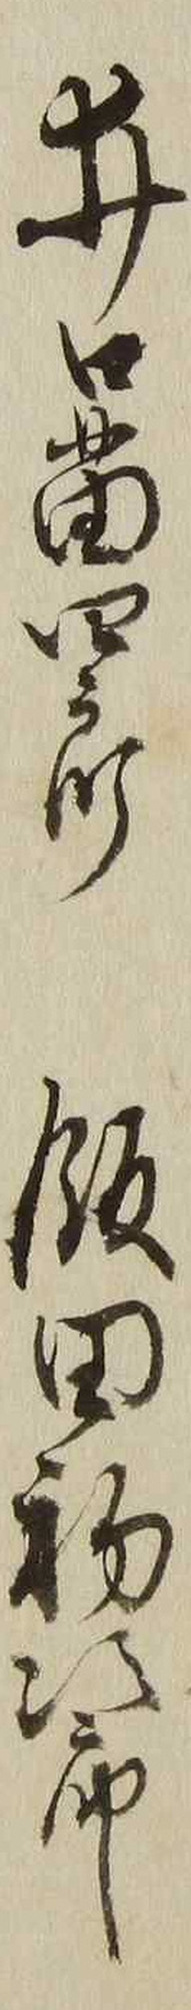井口留四郎飯田初次郎

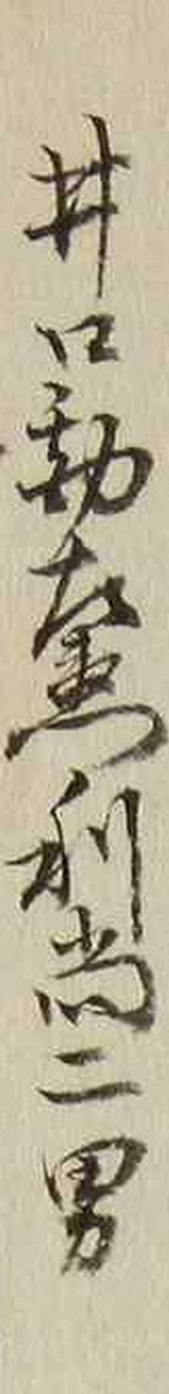井口勘左衛門利尚二男
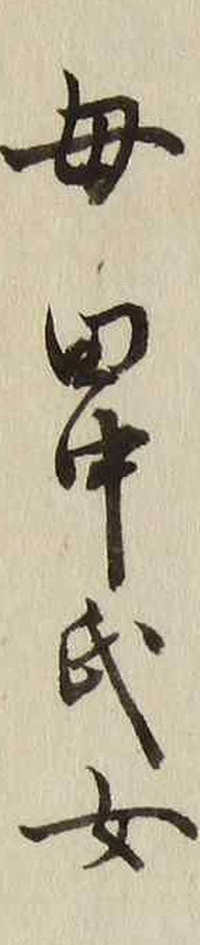母田中氏女
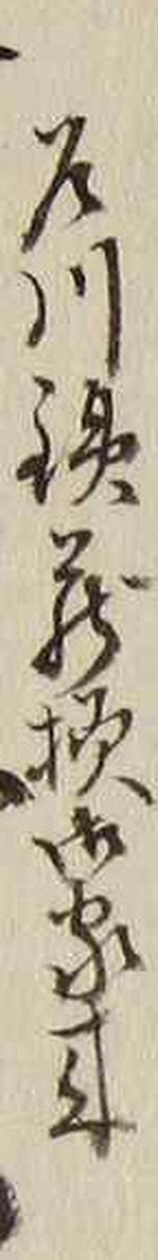石川鉄蔵様御家来
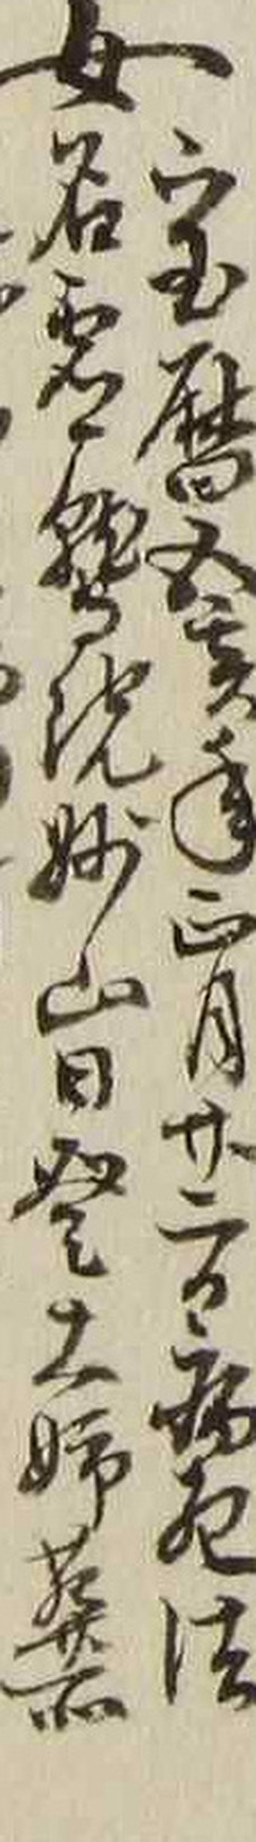名霊鷲院妙山日登大姉葬所
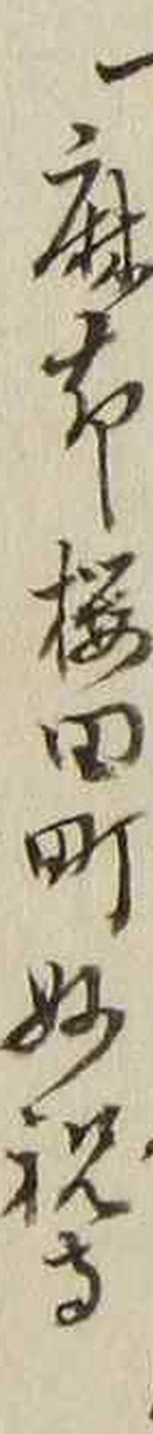麻布桜田町妙祝寺
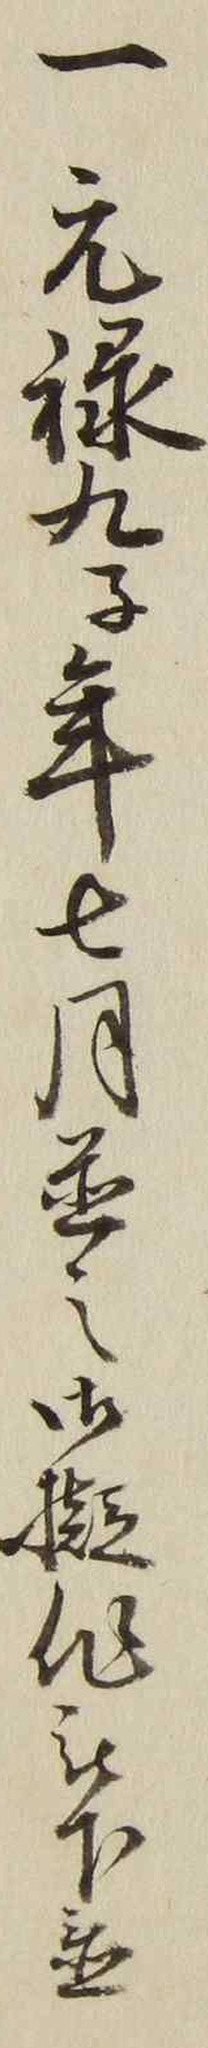一元禄九子年七月並之御擬作被下置

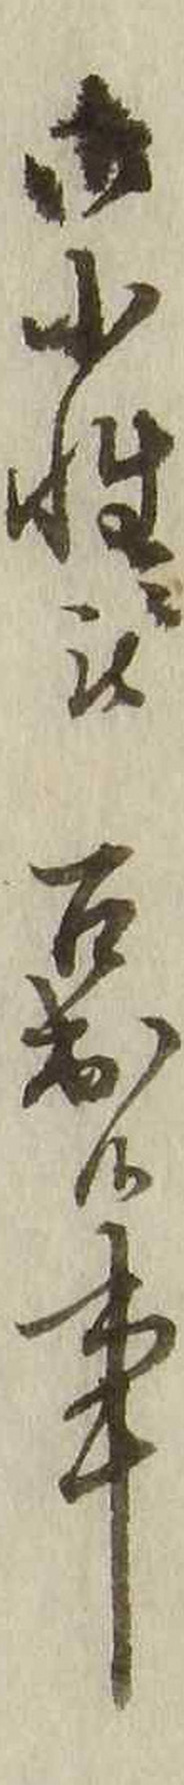御小性ニ被召出候事
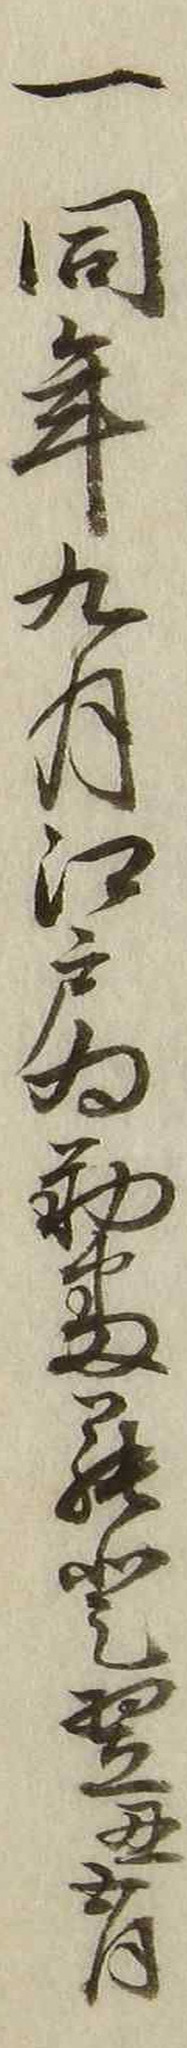一同年九月江戸為勤番罷登翌丑五月
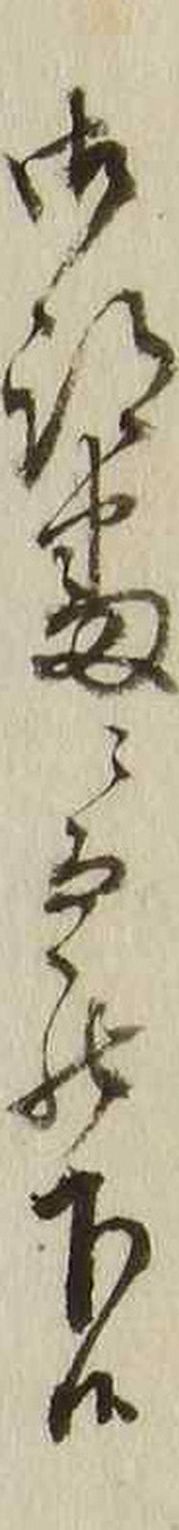御跡番ニ而罷下候
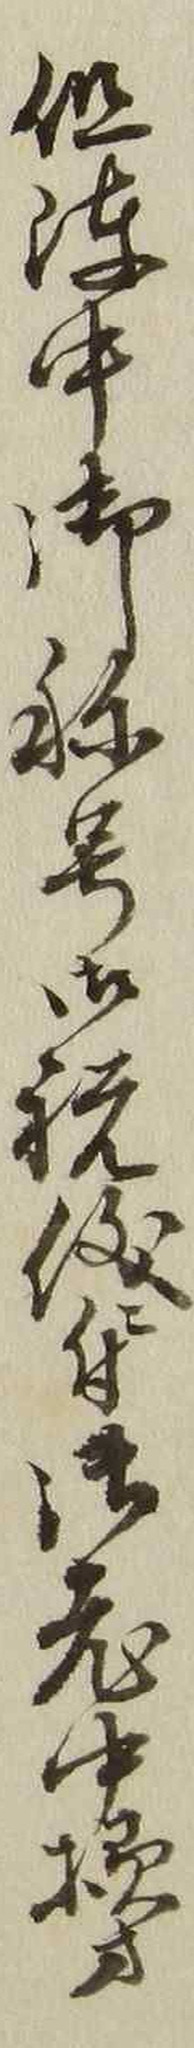但陣中御称号御祝儀ニ付御老中様方
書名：諸士系譜　巻之23　い之部23
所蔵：会津若松市立会津図書館
